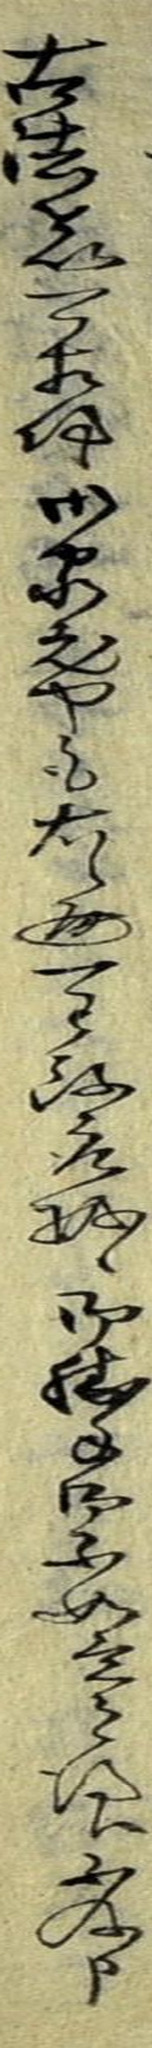古法を以可相伺御家老中ニも右之通可被致取扱候御勝手御不如意ニ候得ハ不及申

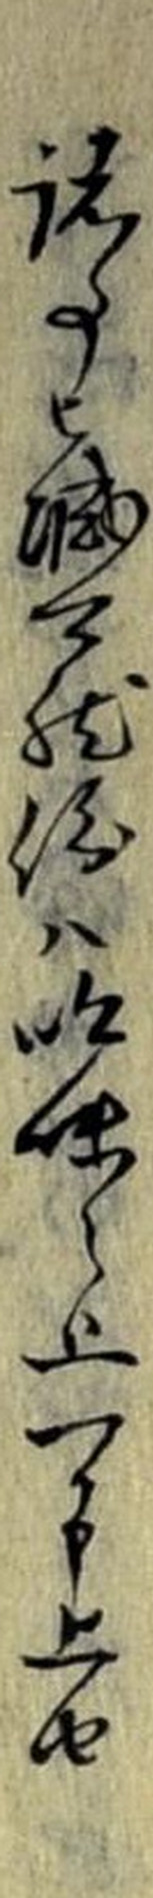諸事被減可然儀ハ吟味之上可申上由
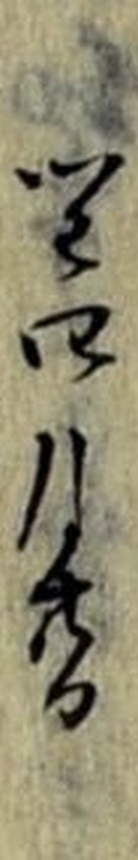閏四月廿日
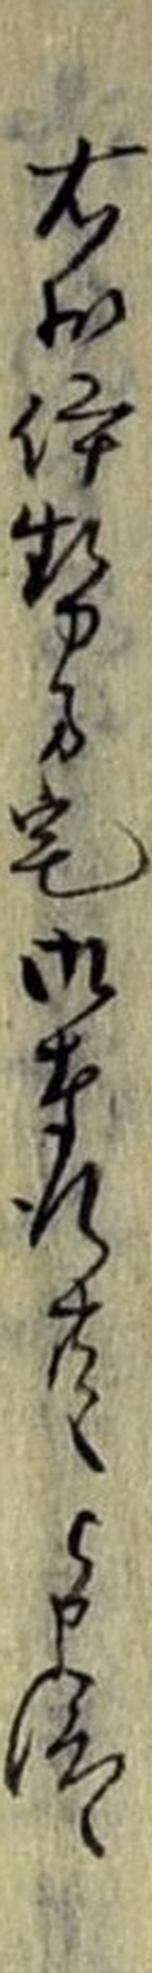右於伊勢方宅御奉行共へ被申渡候
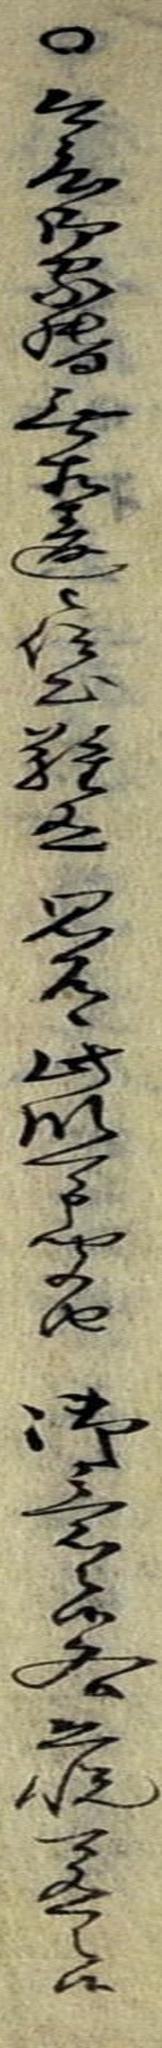〇今度御家督無相違被仰出難有思召候此段可申聞由御意ニ候各恐悦可有之候
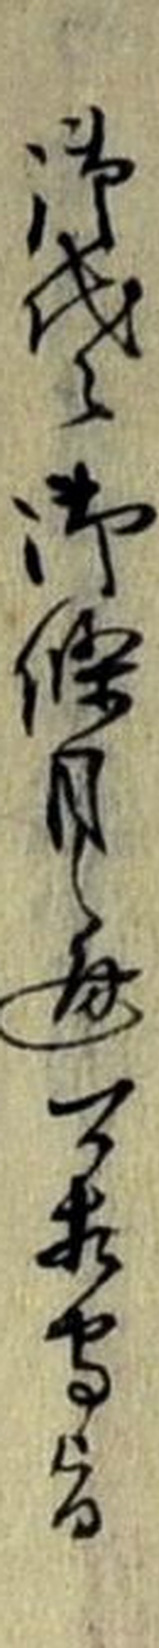御代々御条目之通可相守旨
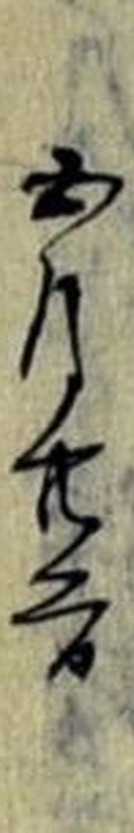五月廿二日
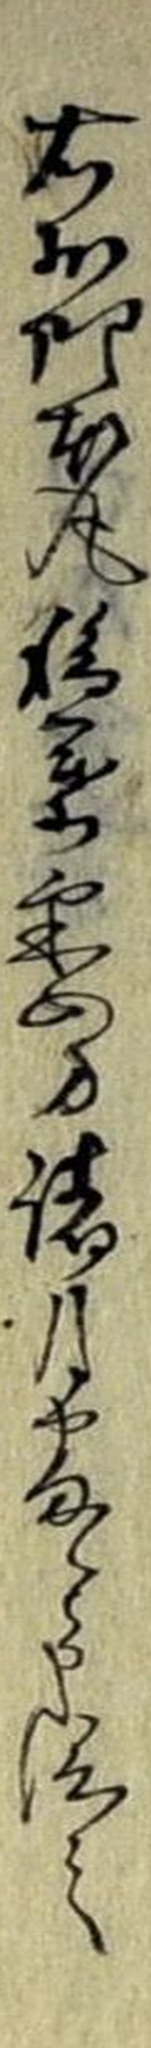右於御本御本丸稲葉采女方諸月番へ被申渡之
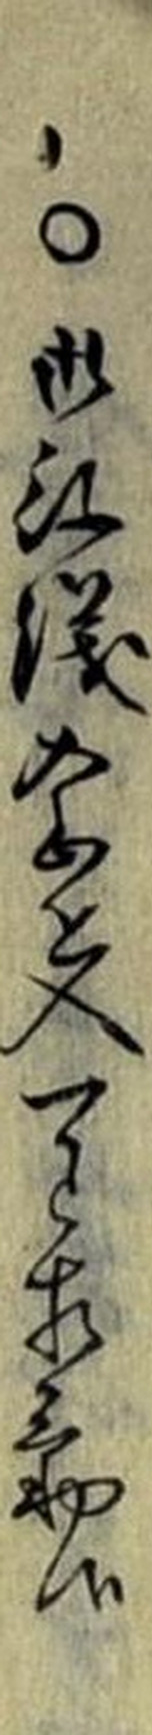〇御役儀念を入可被相勤候
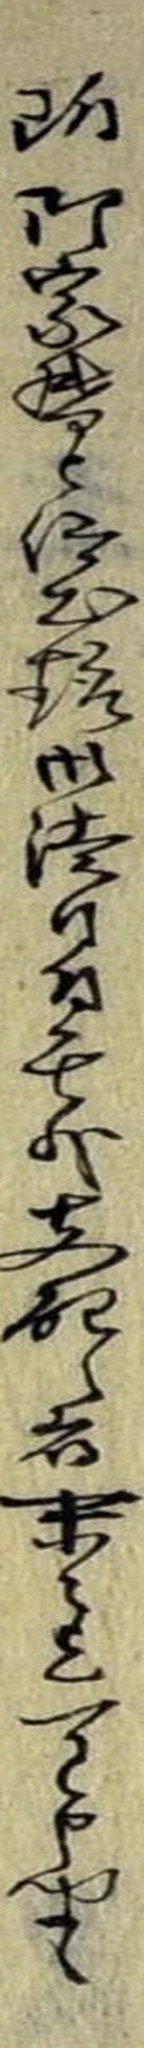附御家督被仰出趣御徒目付其外支配之者末々迄可被申聞候
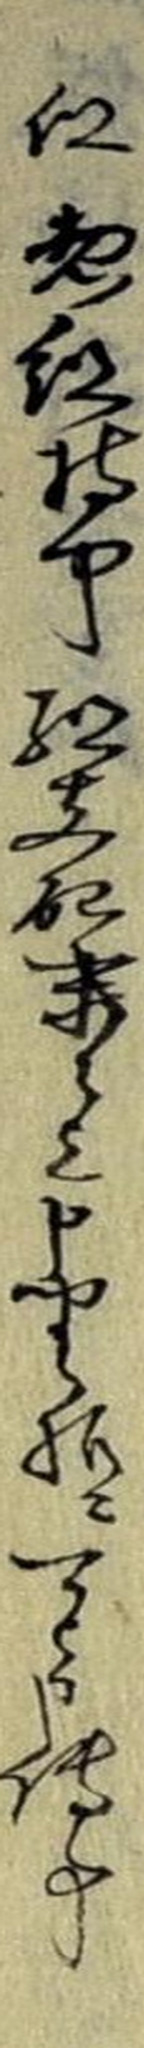但惣組持中組支配末々迄申聞候様ニ可被申伝事
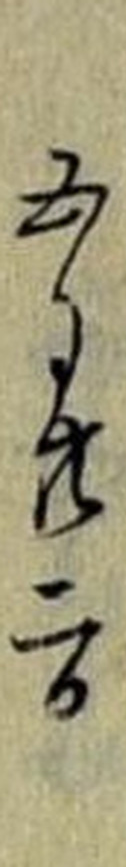五月廿二日
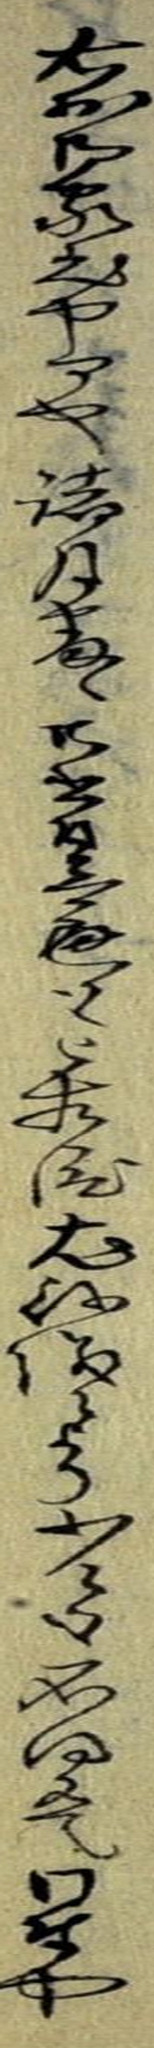右於御家老中部屋諸月番へ御書付壱通ツヽ被相渡尤役儀ニより少々ツヽ不同有之目付中
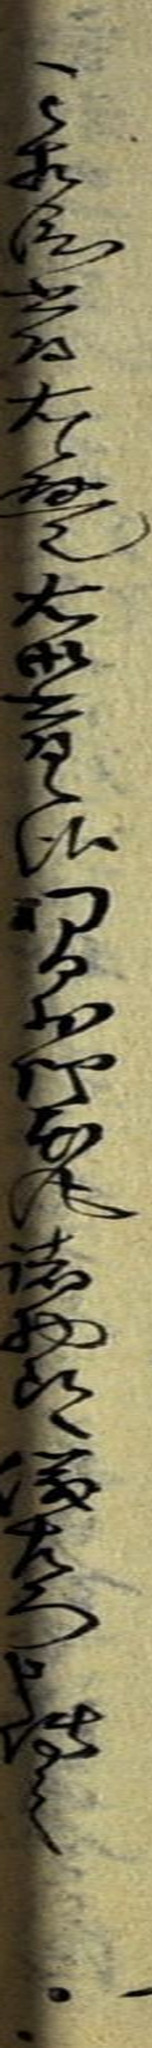へ被相渡書付右之通也右御書付之趣同日於御本丸諸物頭へ儀左衛門申伝之
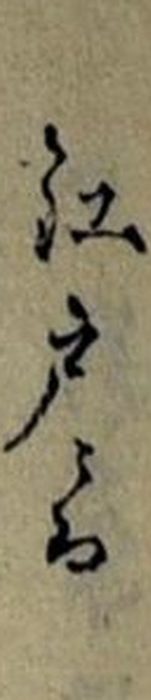江戸ニ而
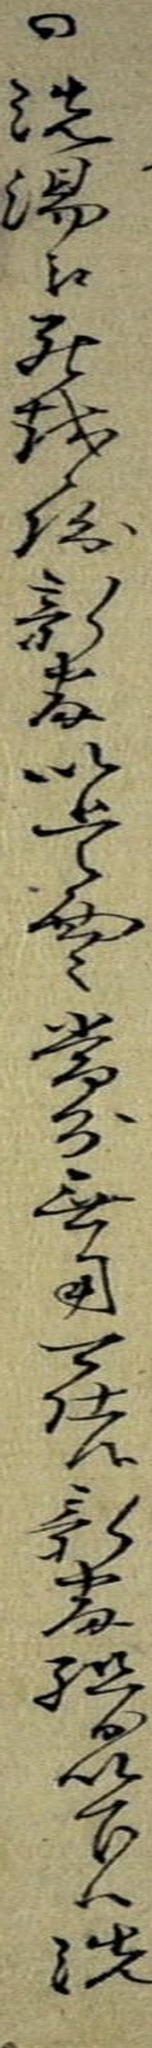〇洗湯江罷越候儀新番以上之面々当分無用可仕候新番組ゟ以下ハ洗
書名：命令之部 一
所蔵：福井県文書館 Fukui Prefectural Archives
